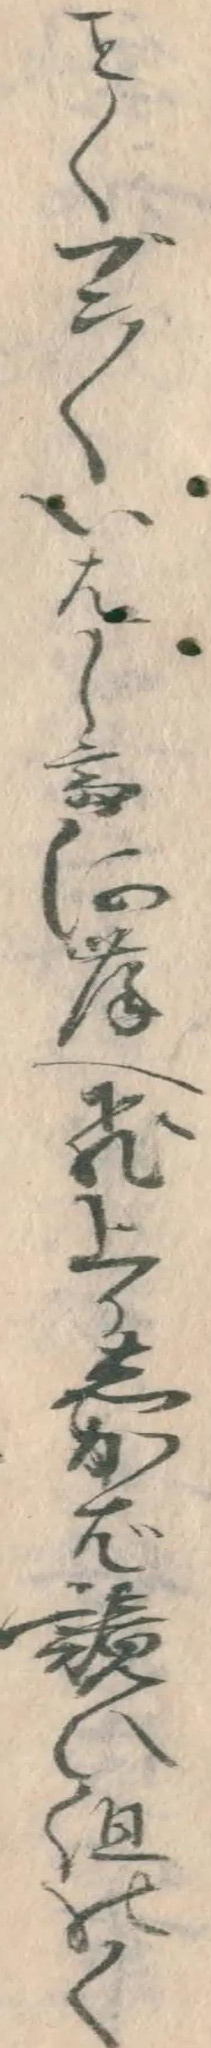ことくブン〳〵いはして河岸へ飛上りしかば競ひ組のく
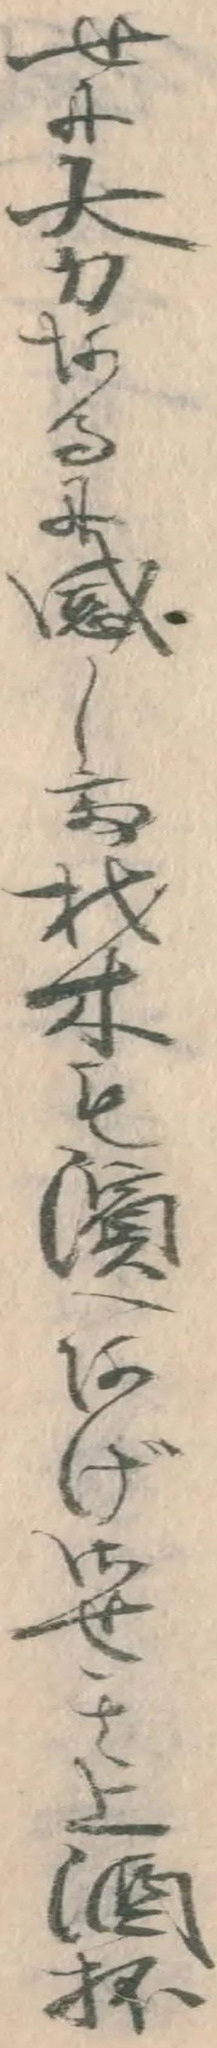せに大力なるに感して材木も浜へあげさせ其上酒抔

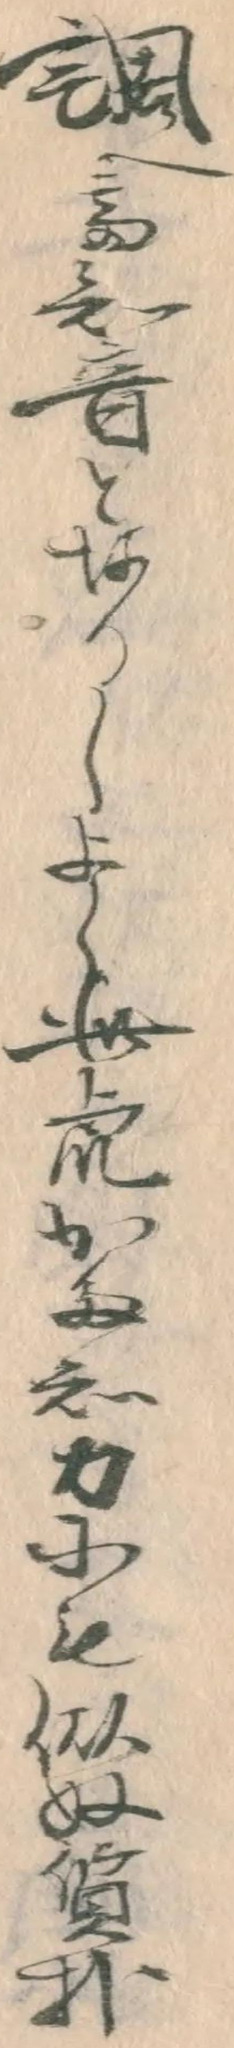調へて知音となりしよし此虎かたち力にも似ぬ質朴
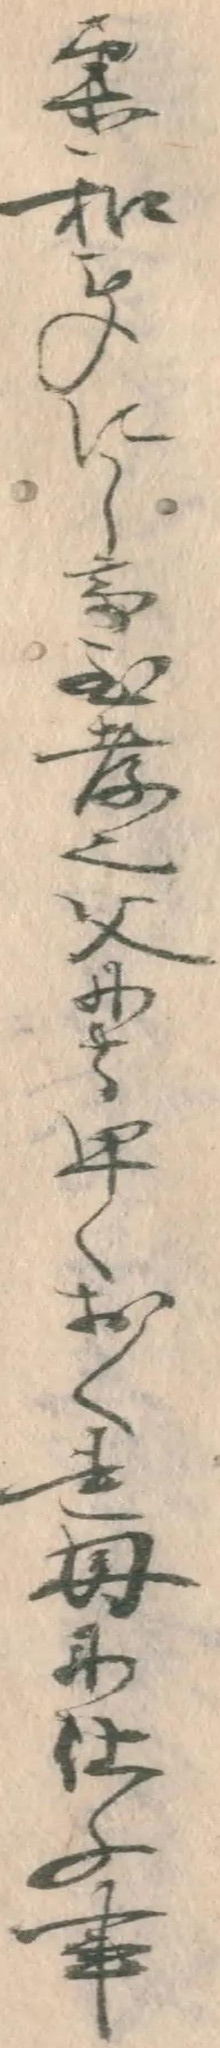柔和ものにして至孝也父には早くおくれ母に仕ふ事
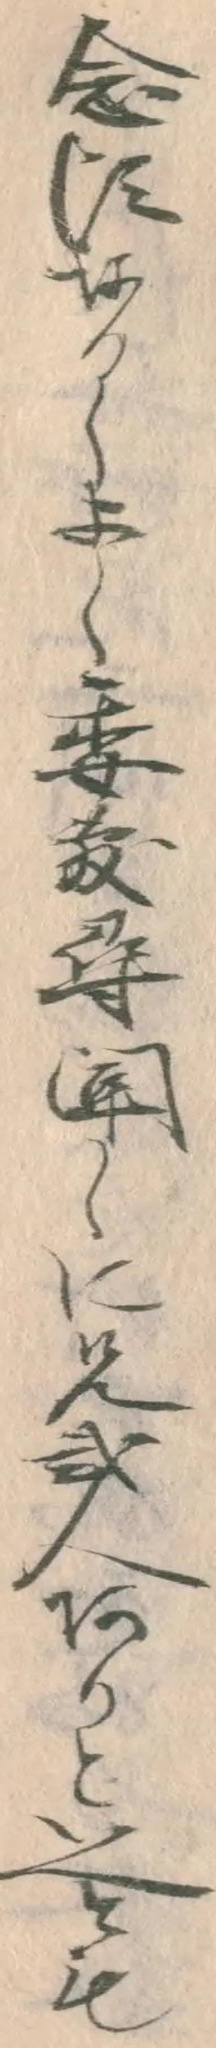念頃なりしよく委敷尋聞くに兄弐人ありといへとも
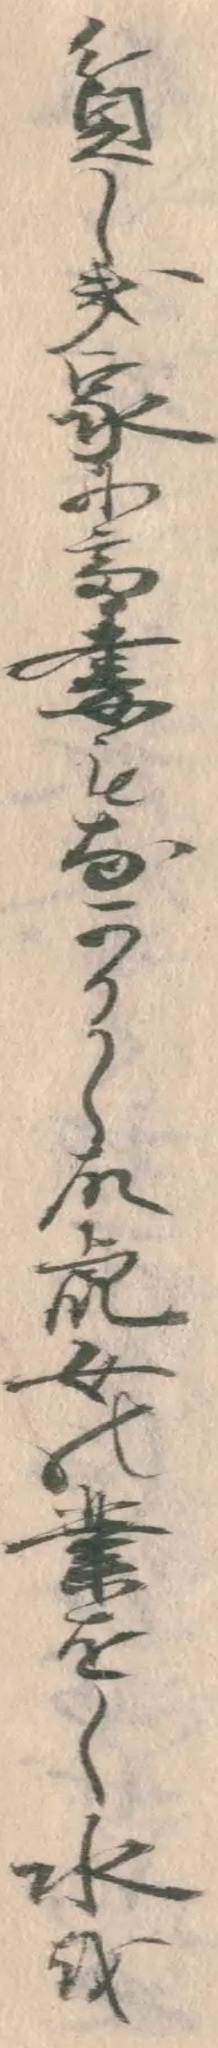貧しき家にて妻もなかりし故虎女の業をし水を
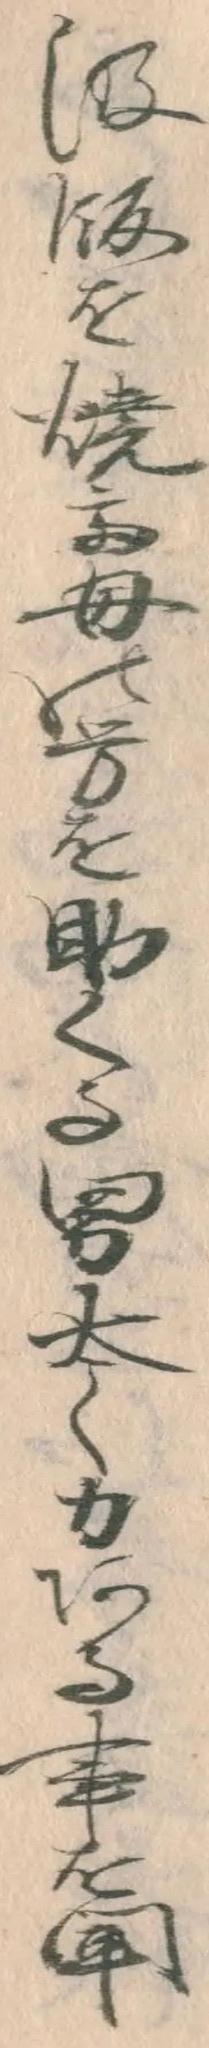汲飯を焼て母の労を助くる男太く力ある事を聞
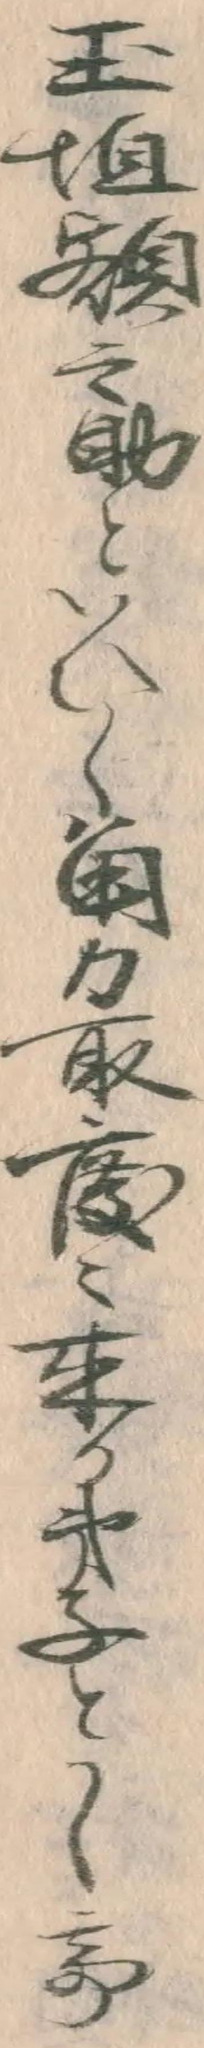玉垣額之助といひし角力取度々来り弟子として
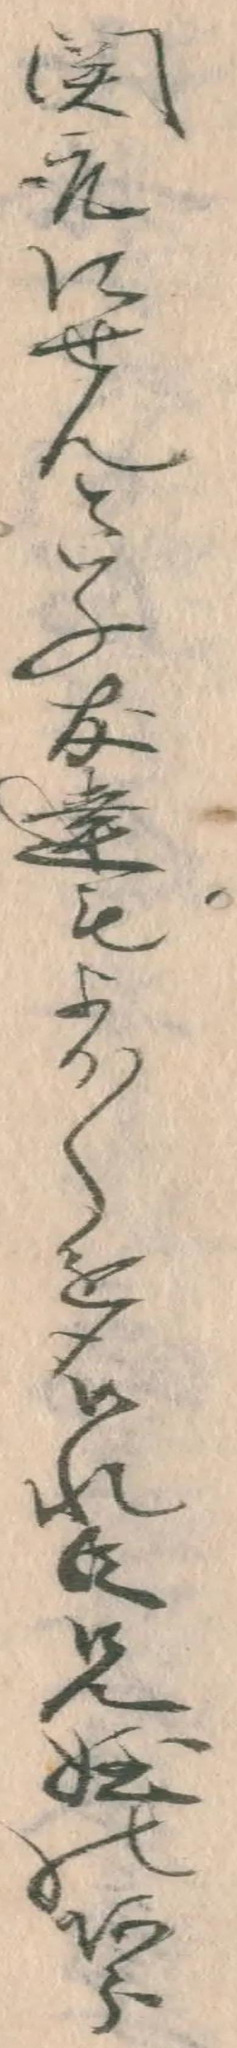関取にせんといふ友達もより〳〵進めけれ共兄姪のあら
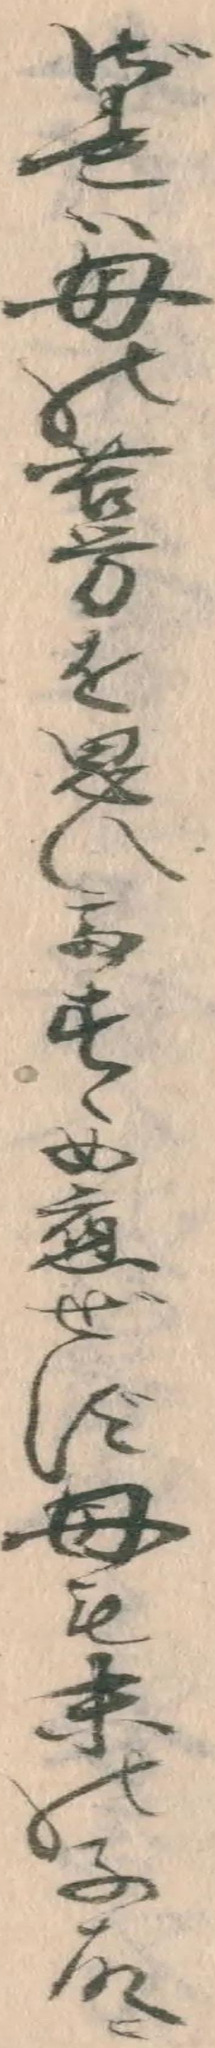ざれは母の苦労を思ひてすゝめ応ぜず母も末の子故に
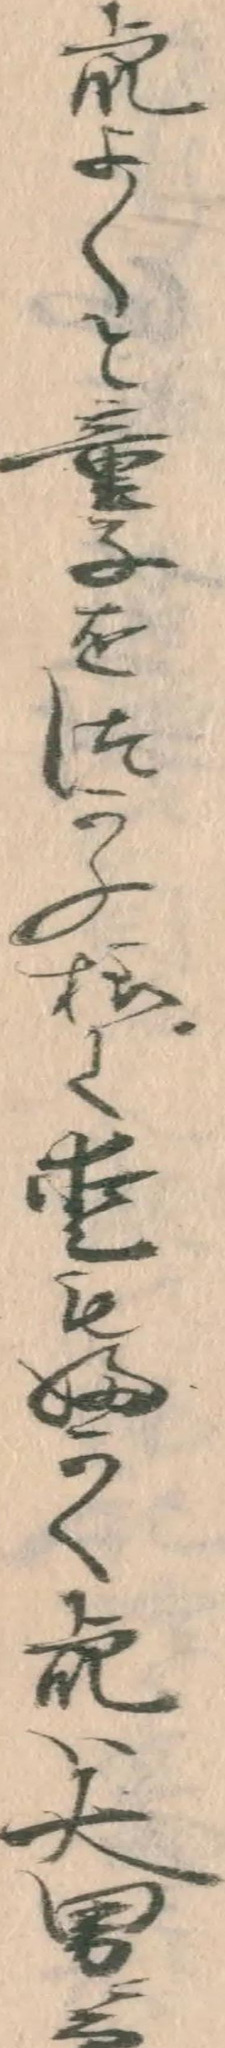虎よ〳〵と童子をつかふ様に愛もふかく虎は大男にて
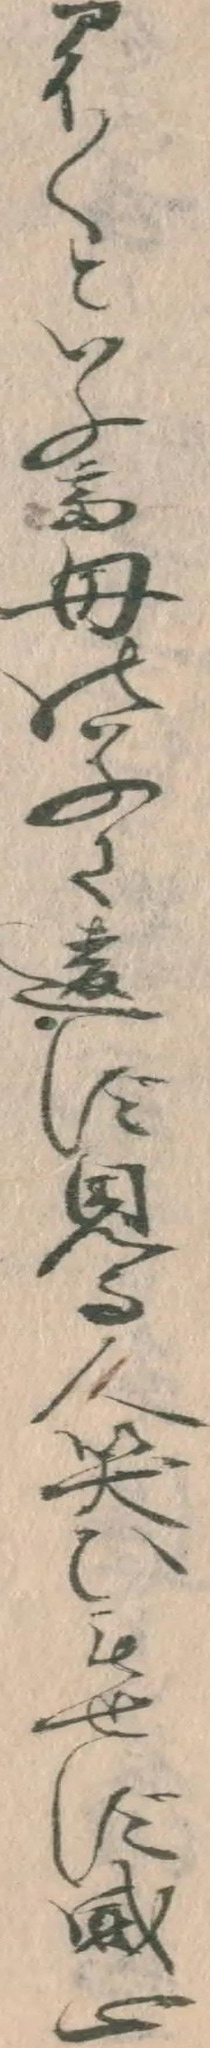アイ〳〵といふて母のいふに違ず見る人笑ひもせず盛心
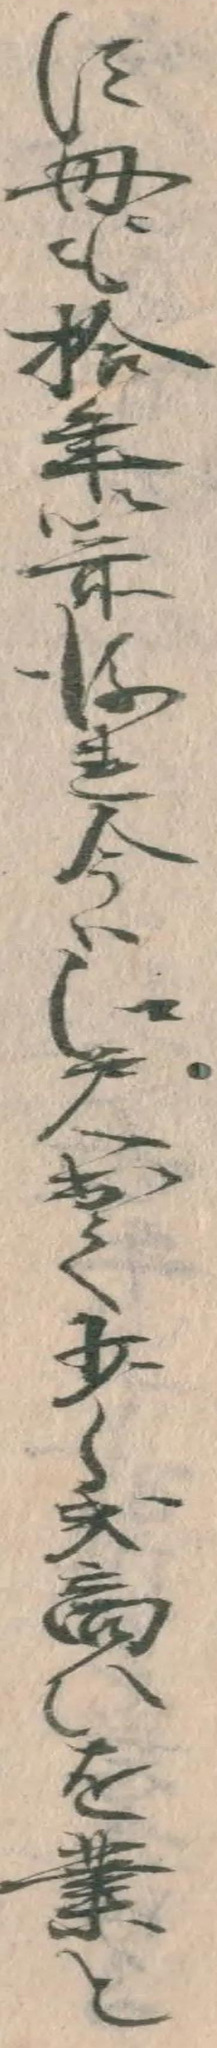す母にも拾年以前後れ今は江戸へ出て少しき商ひを業と
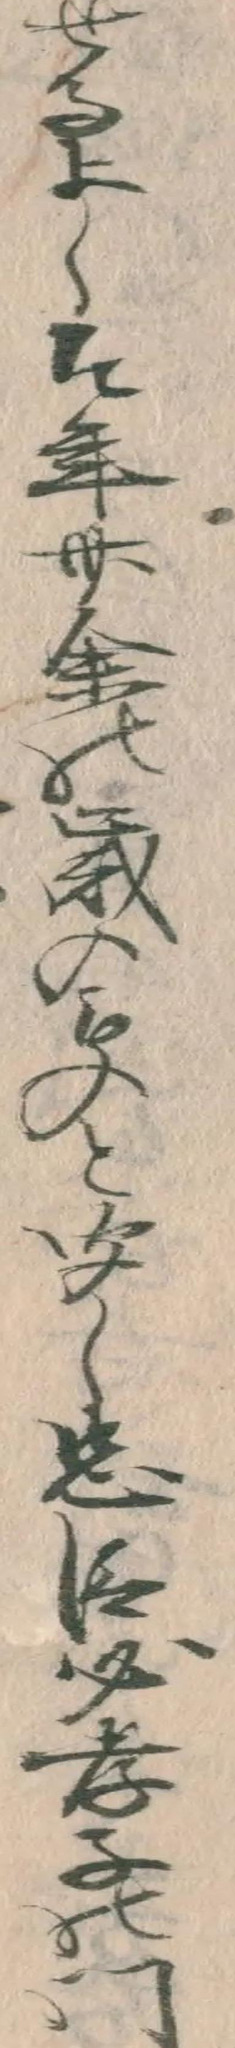せるよし今年卅余の歳のものと聞し忠臣必孝子の門
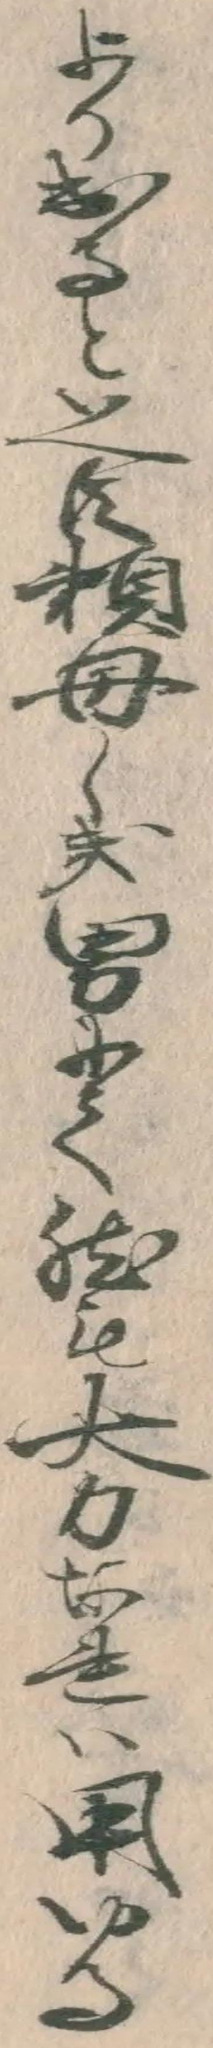より出るといへ共頼もしき男にて然も大力なれは用ゆる
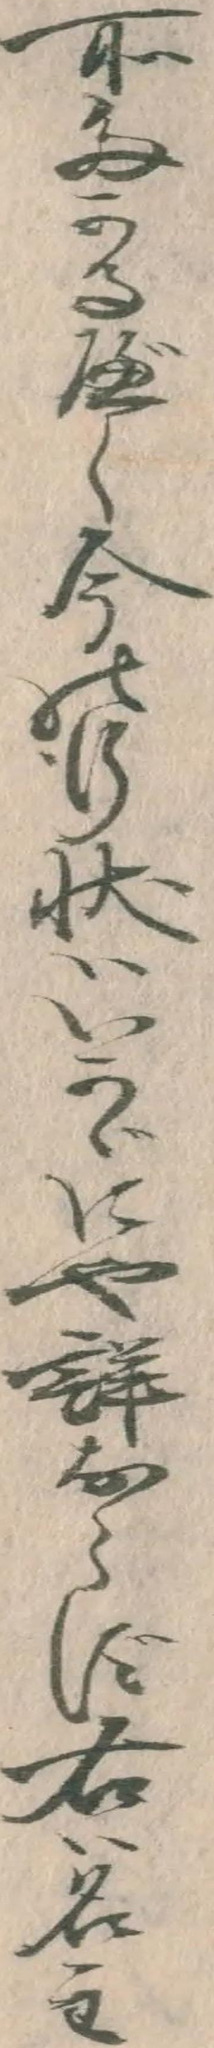所多かるべし今の行状はいかゞにや詳ならず右は名主
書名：四神地名録 6巻. [4]葛飾郡
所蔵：国立国会図書館 National Diet Library, JAPAN
